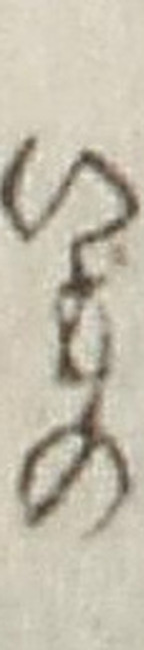いもの
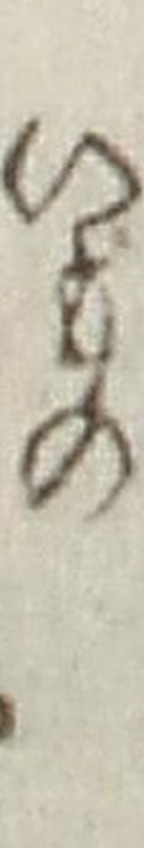いもの
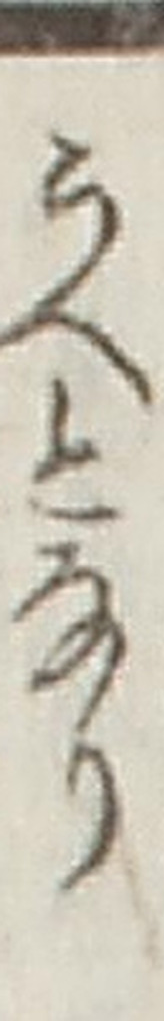うへとなり
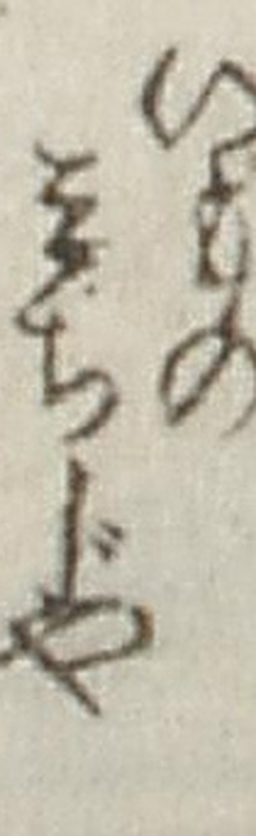みちじや
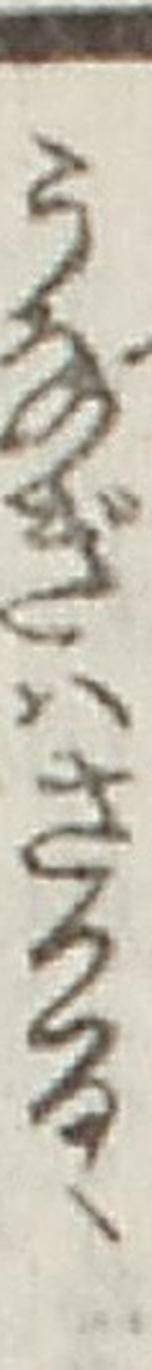うなぎはさかるゝ
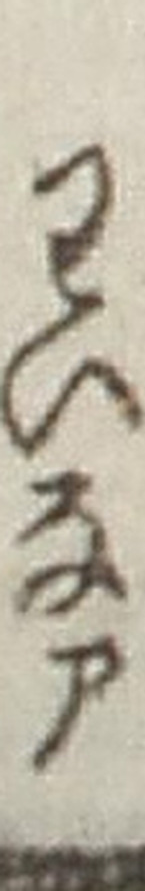わいなァ
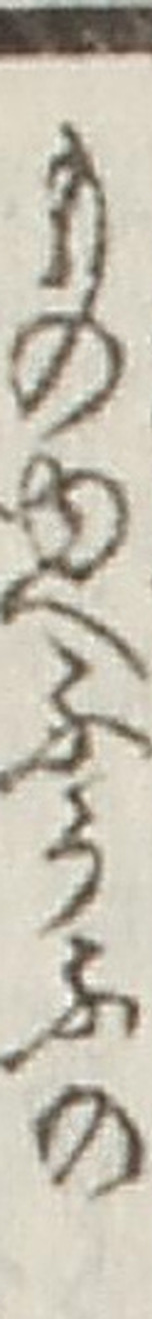ものゆへふうふの
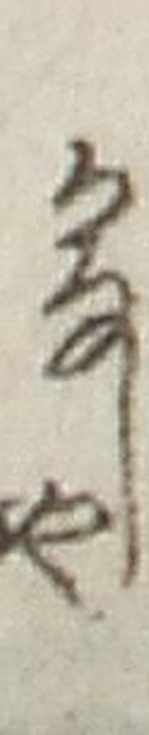かなしや
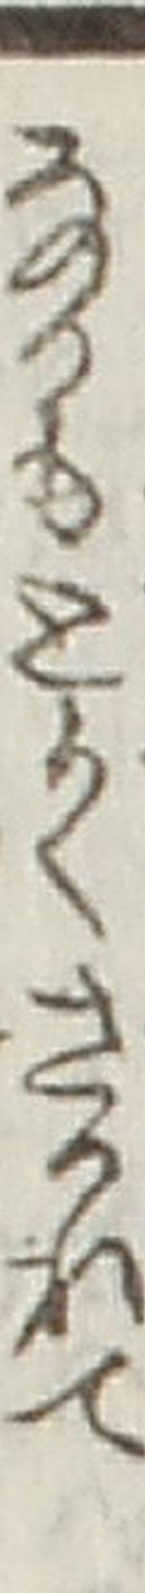なかもとかくさかれて
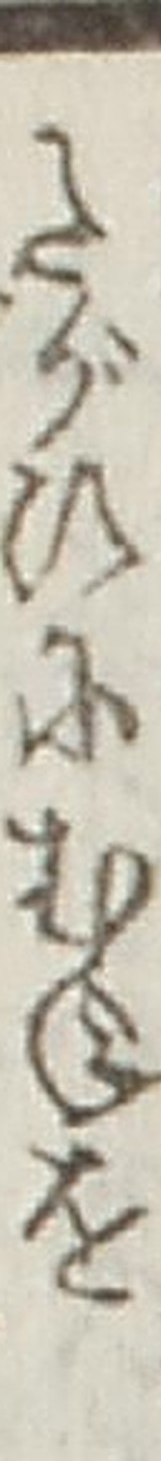たがひにむねを
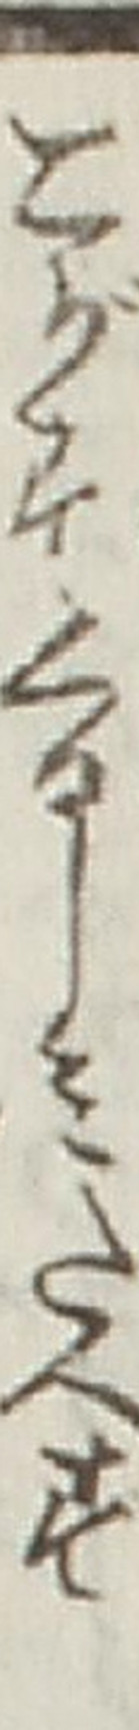こがて？くるしみたへず
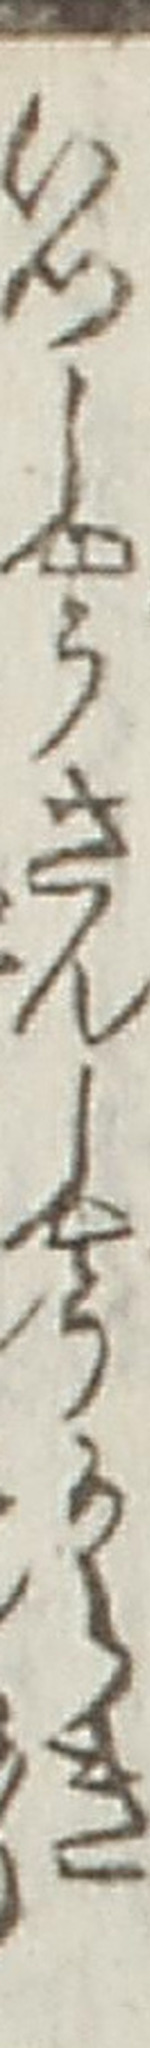いつしやうさんしやうからき
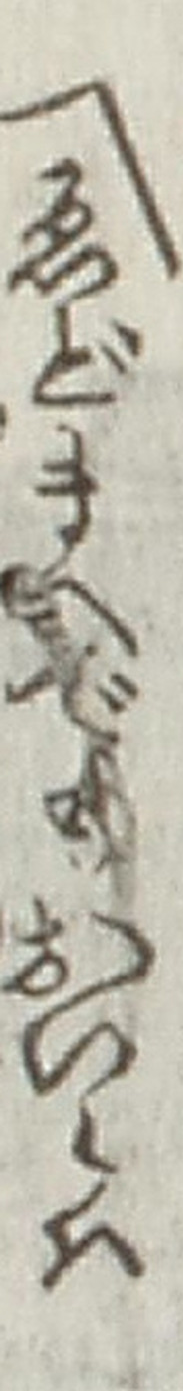〽ゑどまへでも？おいらは
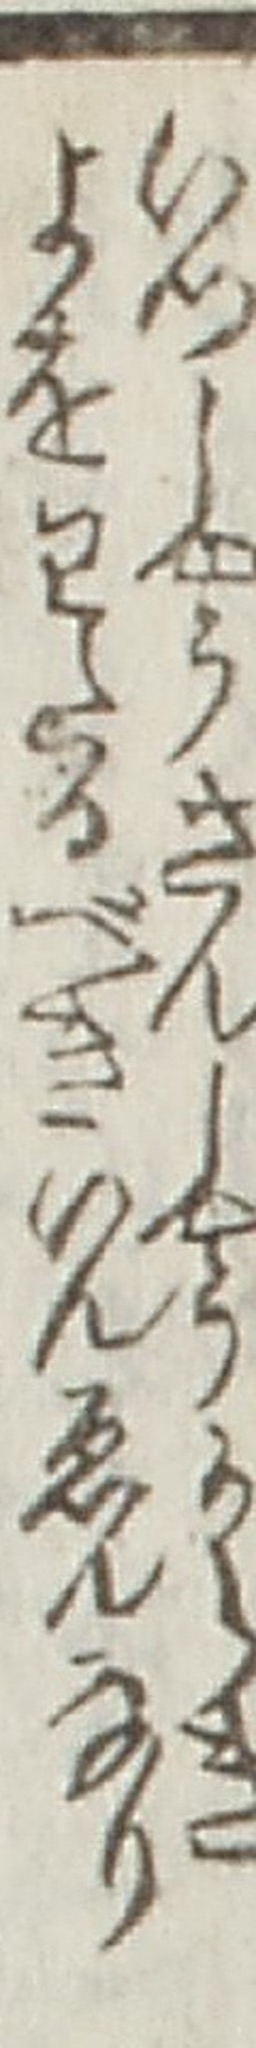よをわたるべきいんゑんなり
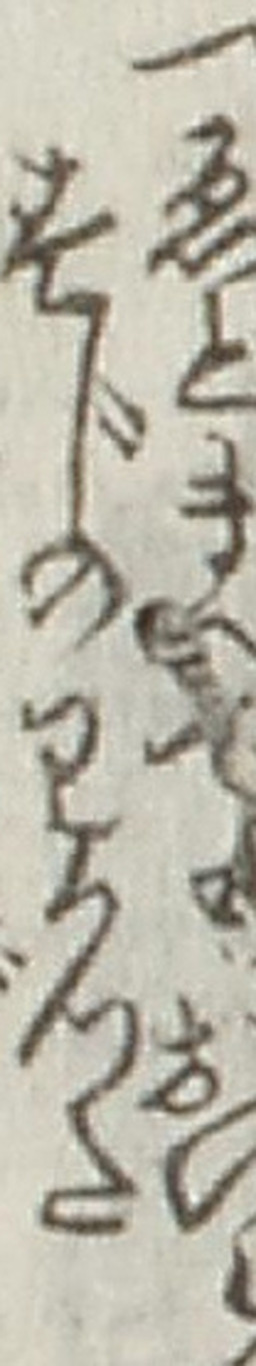すじのわかつた
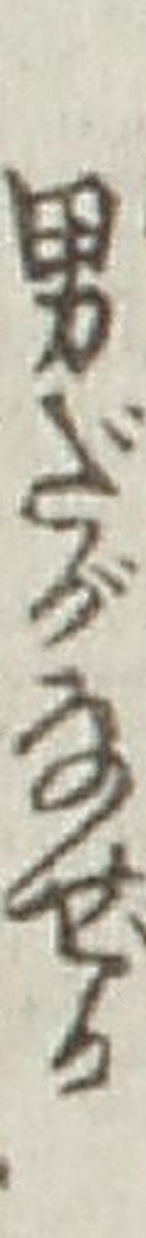男だがなぜか
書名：三世相出雲當座帳　上下冊
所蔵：東京大学地震研究所図書室 Earthquake Research Institute Library, The University of Tokyo, JAPAN
